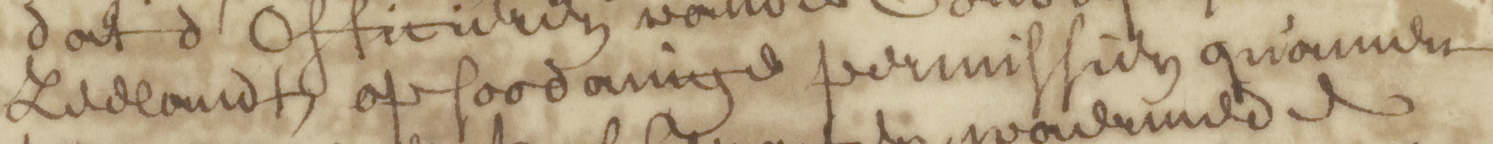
Zeelandt, op soodanige permissien quamen
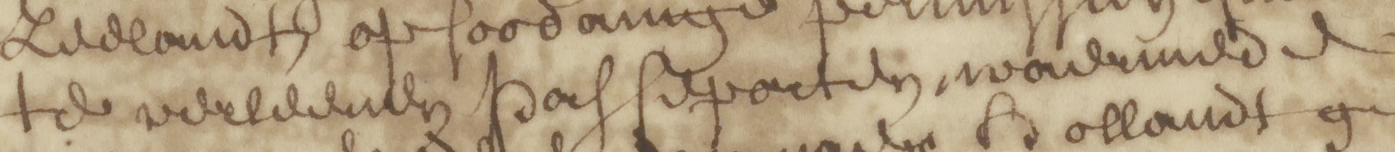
te verleenen Passeporten, waermede
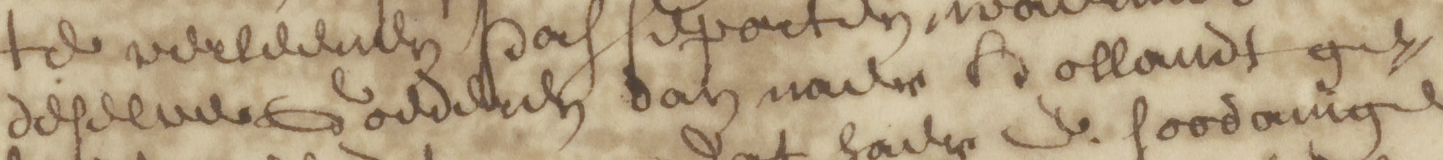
deselve Goederen dan naer Hollandt ge„,
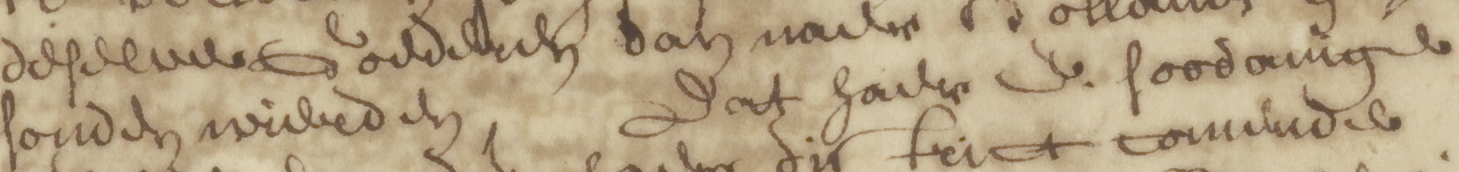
sonden wierden, Dat haer E. soodanige
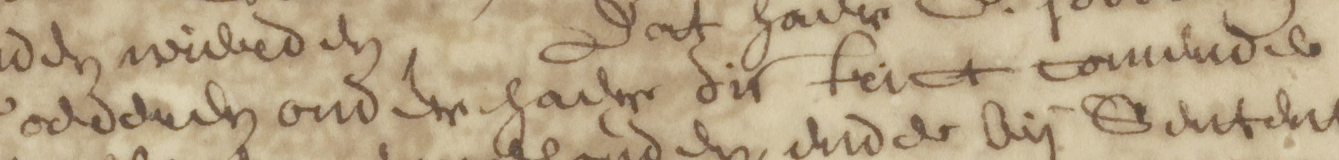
Goederen onder haer district comende
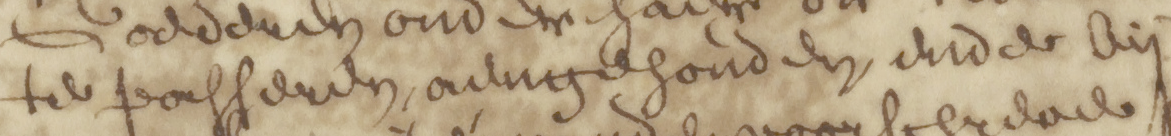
te passeren, aengehouden, ende bij Sententie,
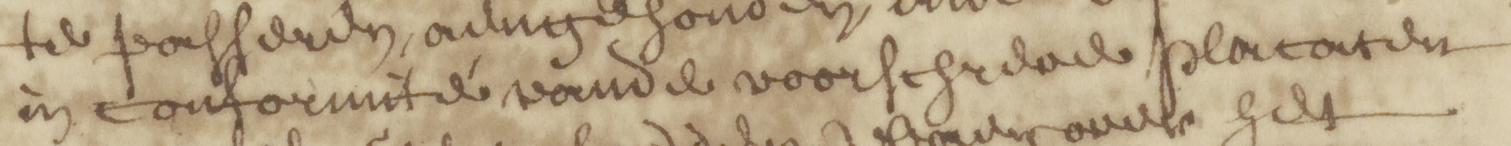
in conformité vande voorschreve Placaten
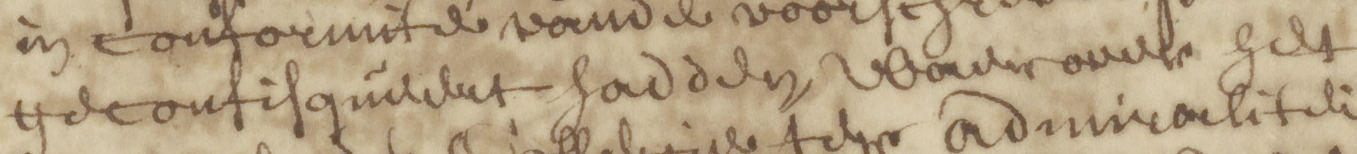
geconfisqueert hadden, waerover het
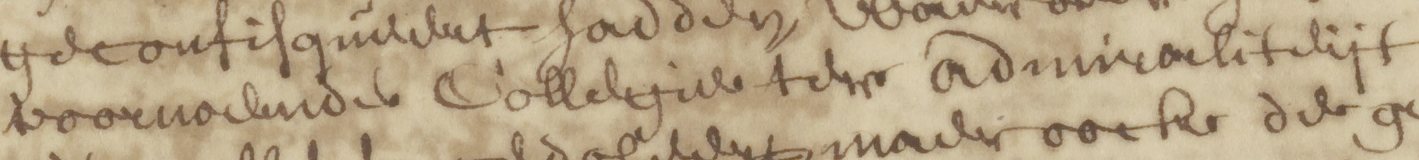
voornoemde Collegie ter Admiraliteijt
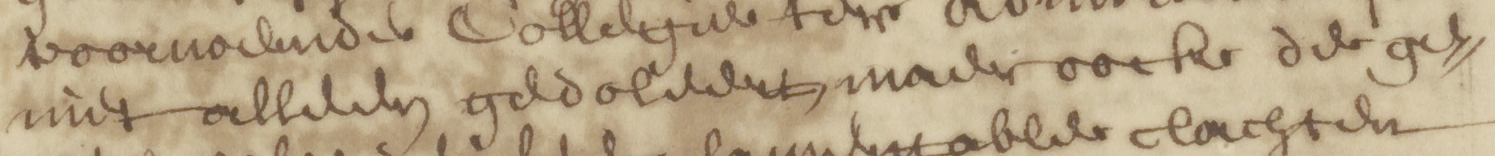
niet alleen gedoleert, maer oock de ge„
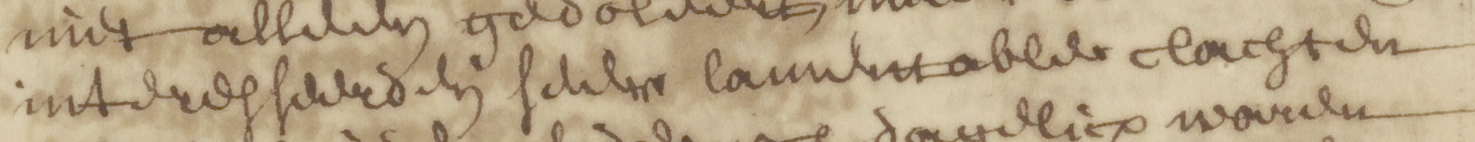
interesseerden haer lamentable clachten
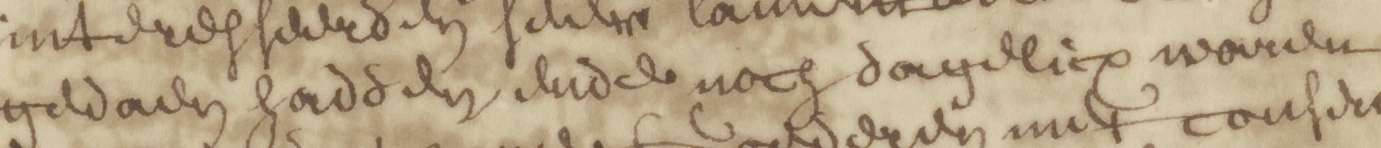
gedaen hadden, ende noch dagelicx waren
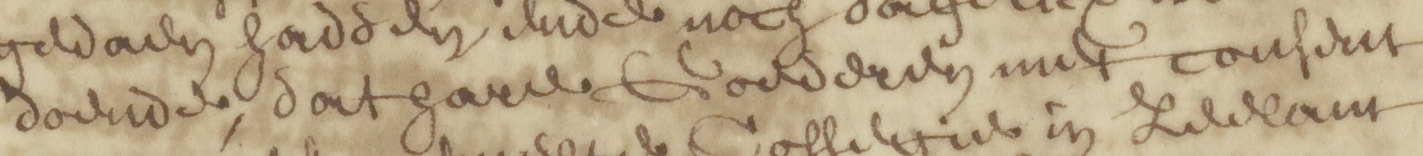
doende, dat hare Goederen met consent
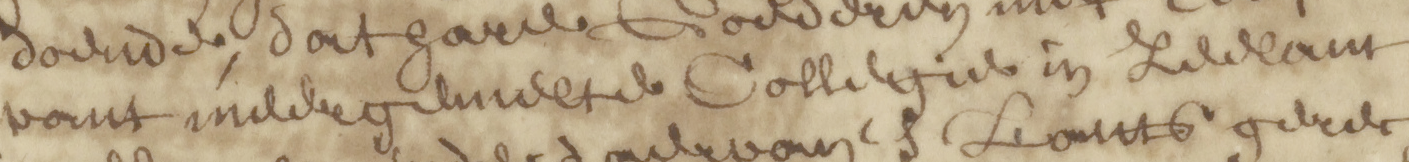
vant meergemelte Collegie in Zeelant
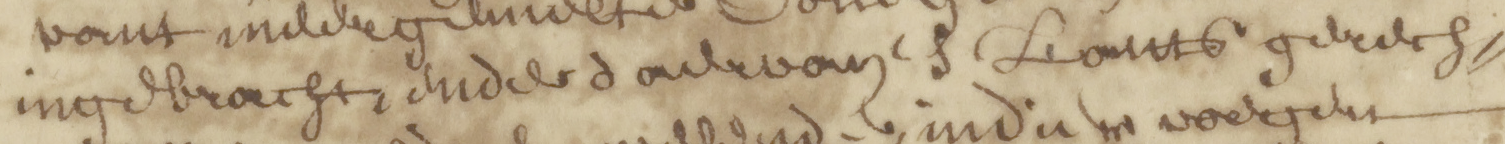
ingebracht, ende daervan ‛s Lants gerech„
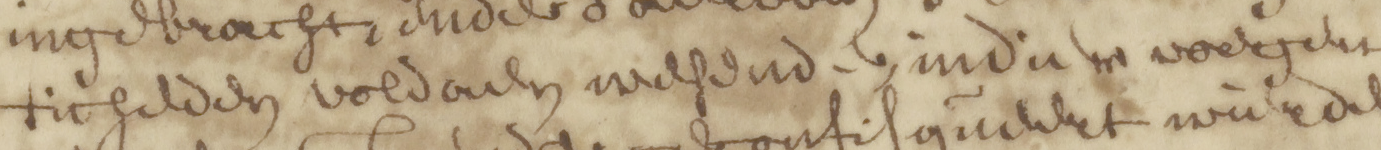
ticheden voldaen wesende, indier voegen
